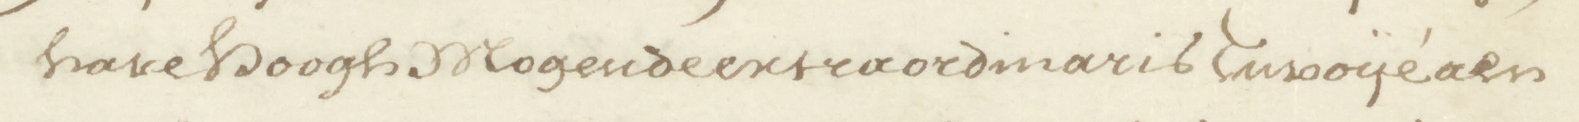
hare Hoogh Mogende extraordinaris Envoijé aen
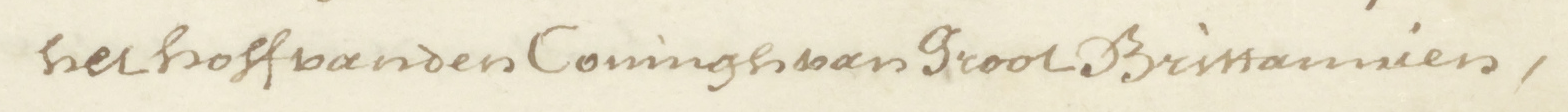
het hoff vanden Coningh van Groot Brittannien,
